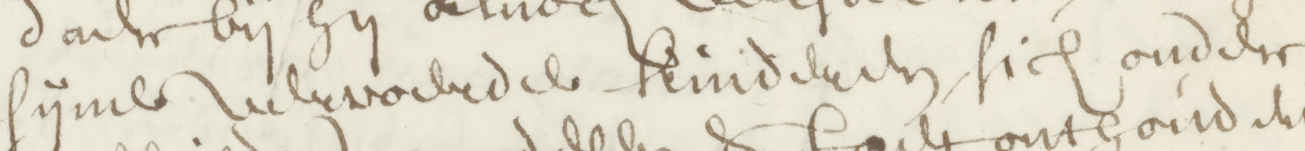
sijne vervoerde kinderen, sich onder
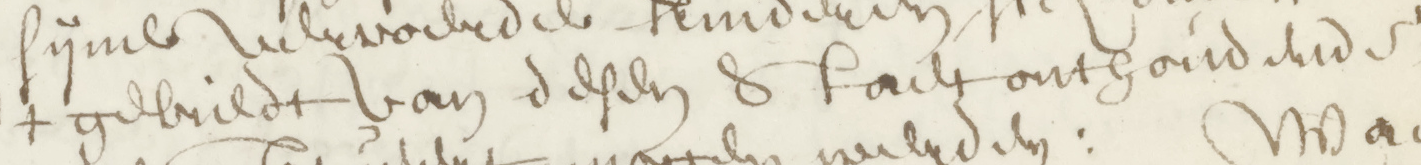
‛t gebiedt van desen Staet onthoudende
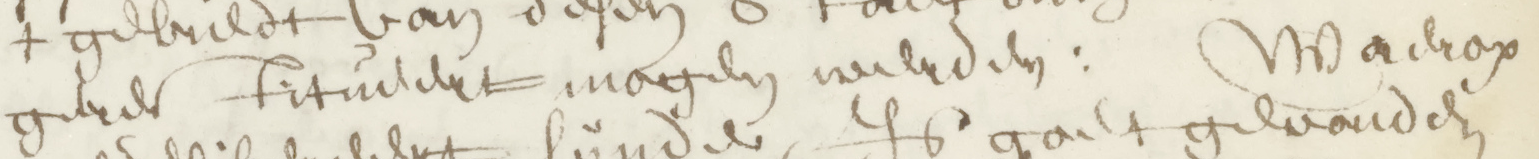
gerestitueert mogen werden: Waerop
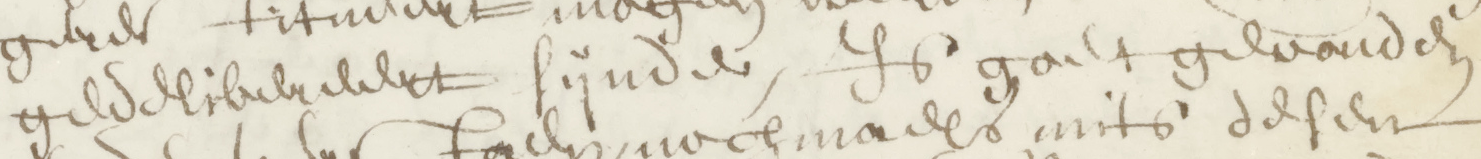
gedelibereert sijnde, Is goetgevonden
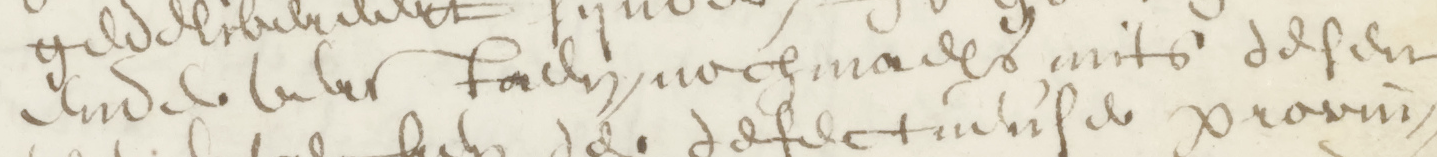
ende verstaen, nochmaels mits desen
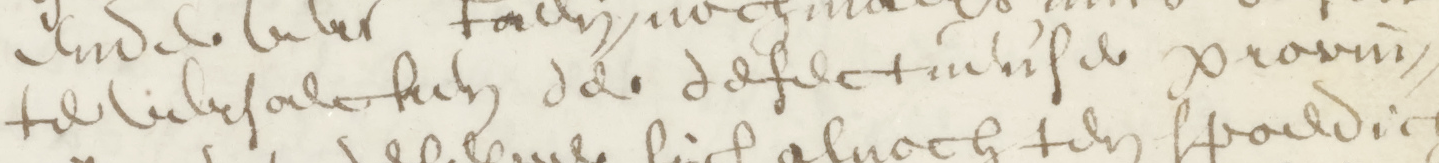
te versoecken de defectueuse provin„,
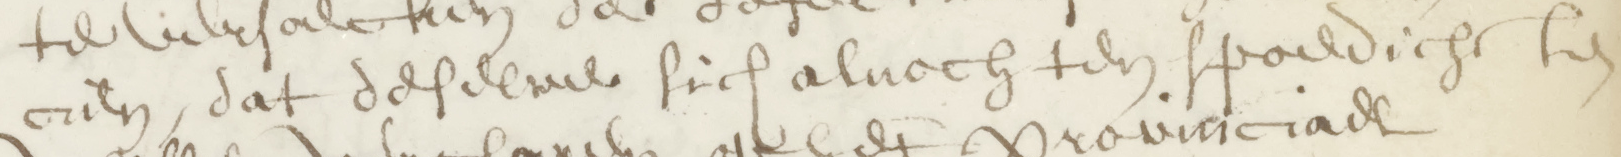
cien dat deselve sich alnoch ten spoedichsten
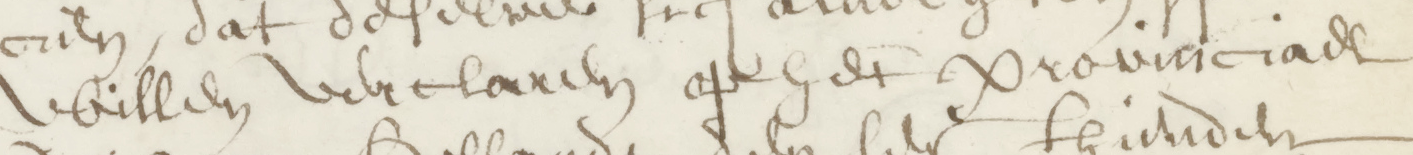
willen verclaren op het Provinciael
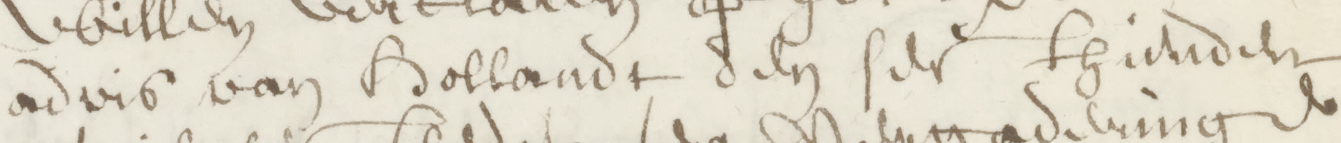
advis van Hollandt den sesthienden
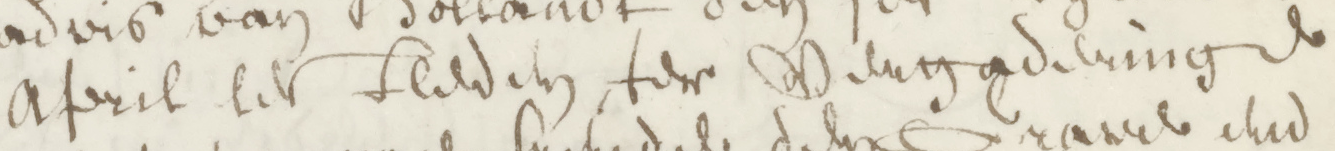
April lestleden, ter Vergaderinge
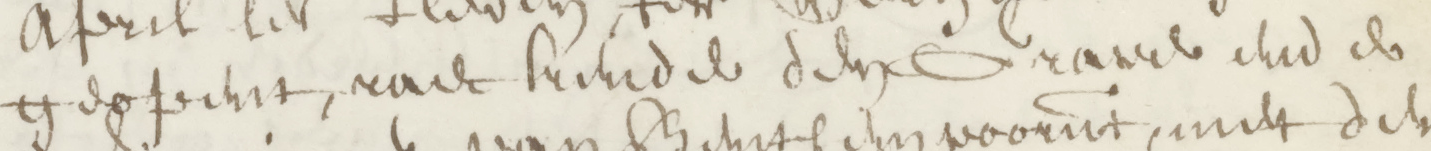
geopent, raeckende den Grave ende
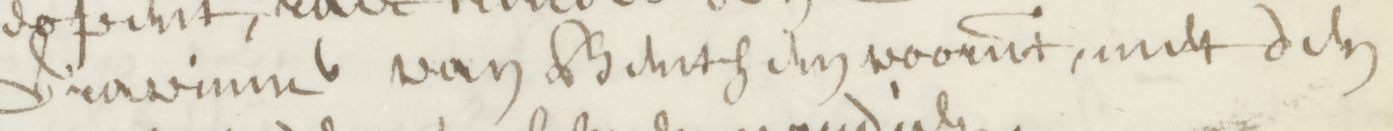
Gravinne van Benthem voornt, met den
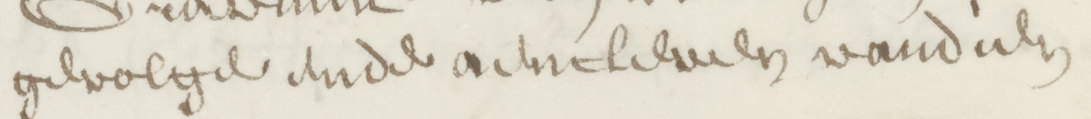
gevolge ende aencleven vandien.
